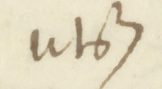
uts
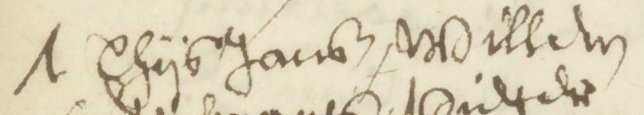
^ Thijs Jans, Willem
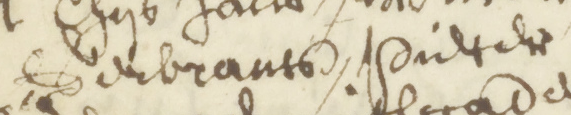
Gerbrants, Pieter
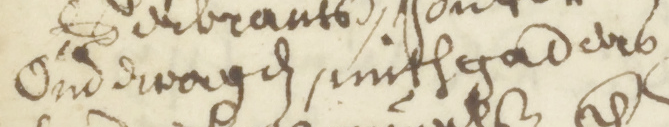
Oudewagen, mitsgaders
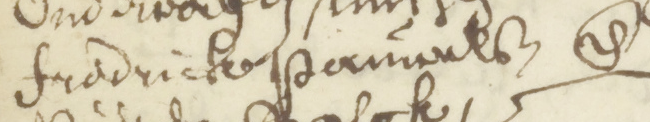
Fredrick Pauwels &
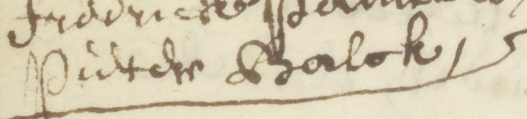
Pieter Balck.
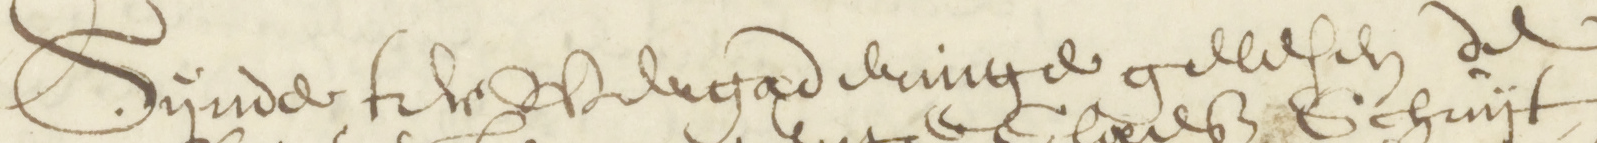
Sijnde ter Vergaderinge gelesen de
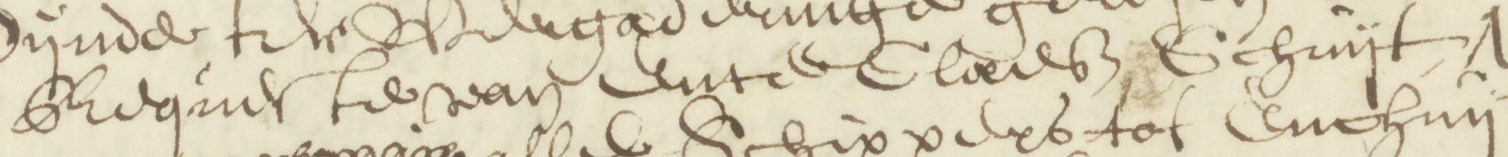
Requeste van Ente Claes Schuijt ^
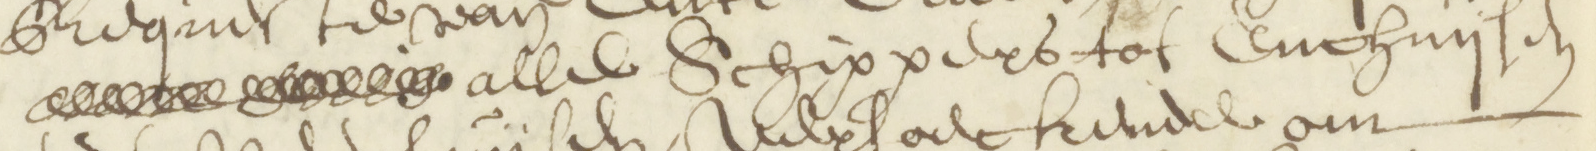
alle xxxx alle Schippers tot Enchuijsen
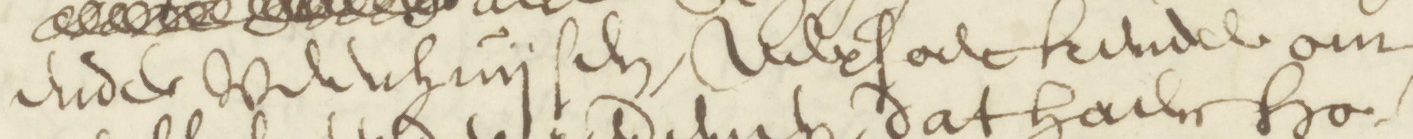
ende Veenhuijsen, versoeckende om
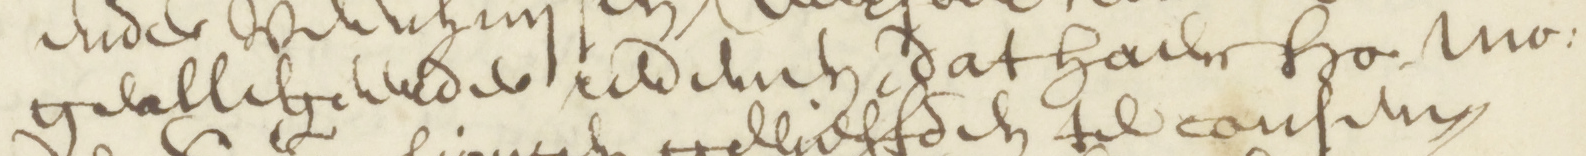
geallegeerde redenen, dat haer Ho:Mo:
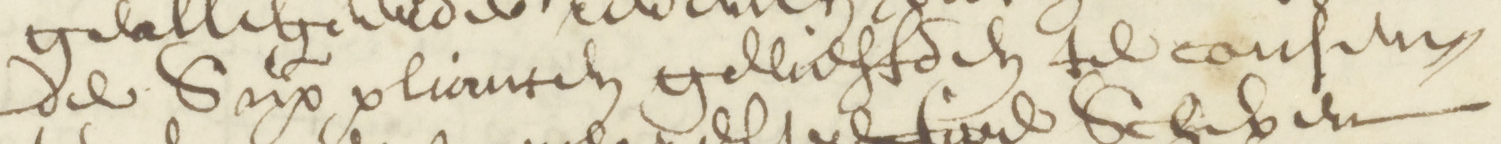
de Supplianten gelieffden te consen„
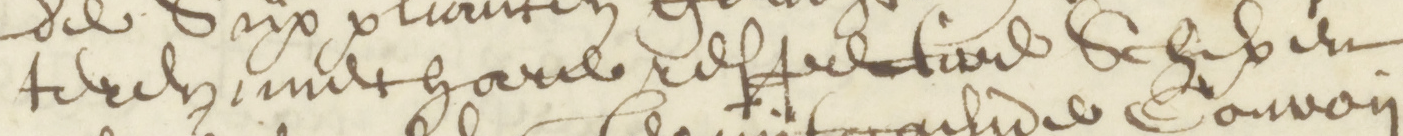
teren, met hare respective Schepen
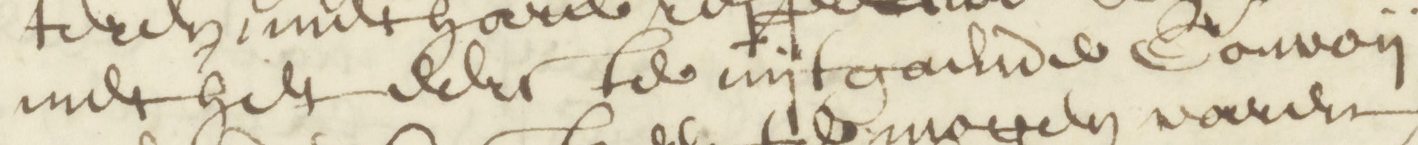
met het eerste uijtgaende Convoij
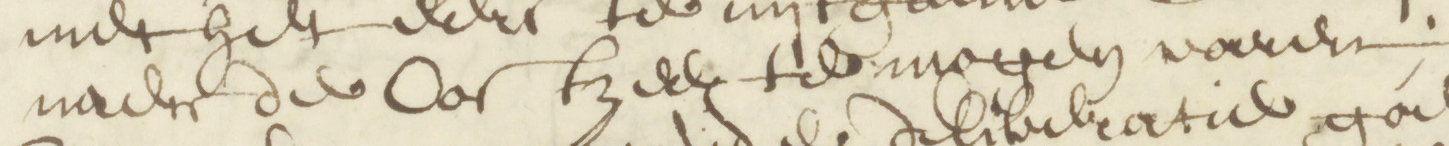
naer de Oostzee te mogen varen.
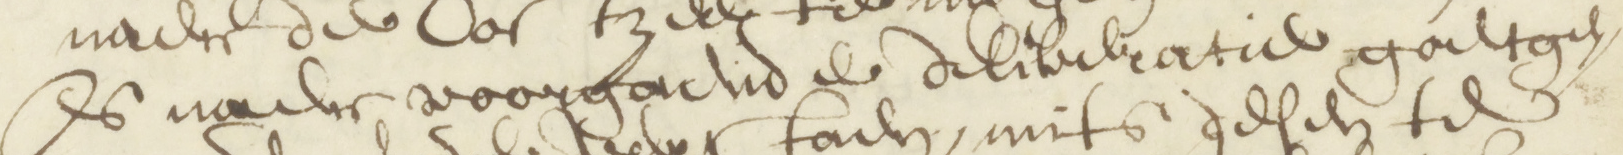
Is naer voorgaende deliberatie goetge,,
